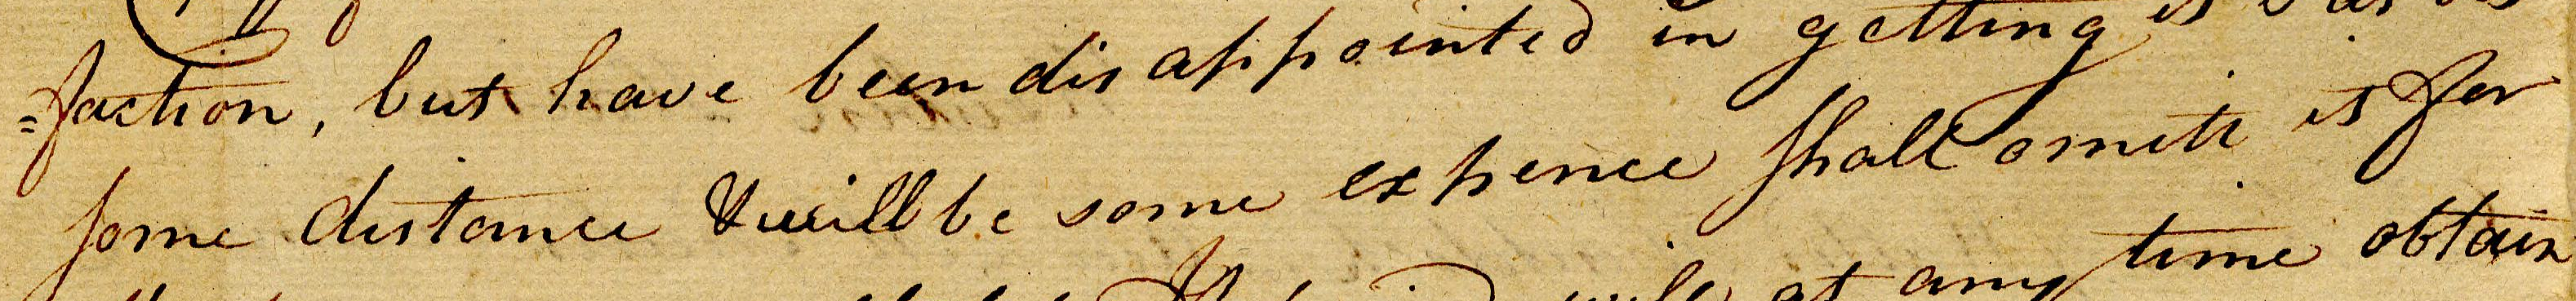some distance & will be some expence shall omitt it for
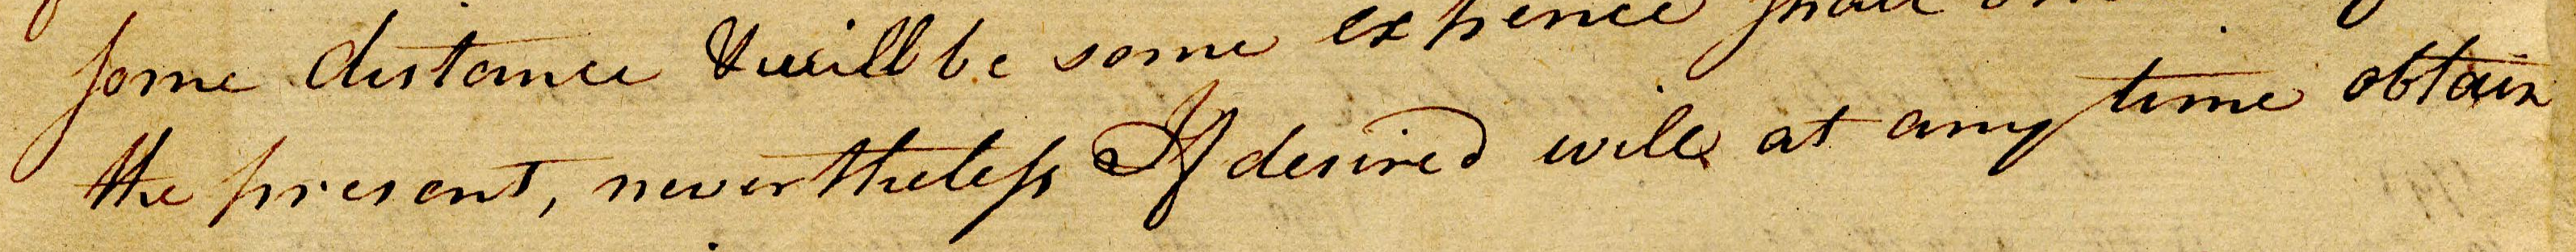the present, nevertheless If desired will at any time obtain
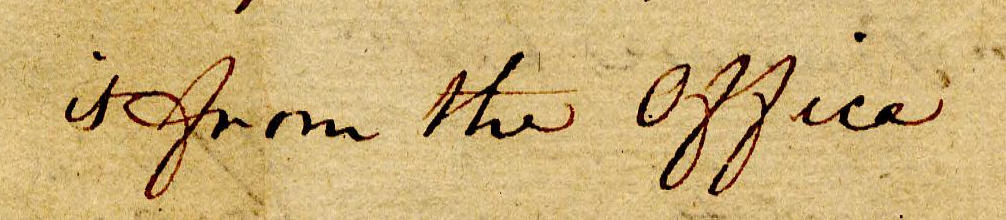is from the office
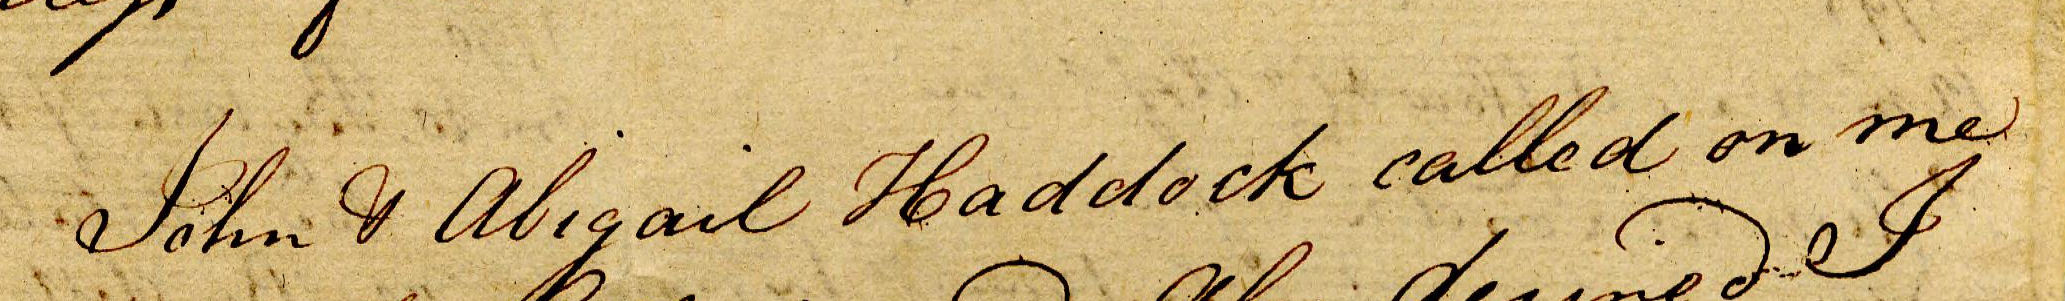John & Abigail Haddock called on me
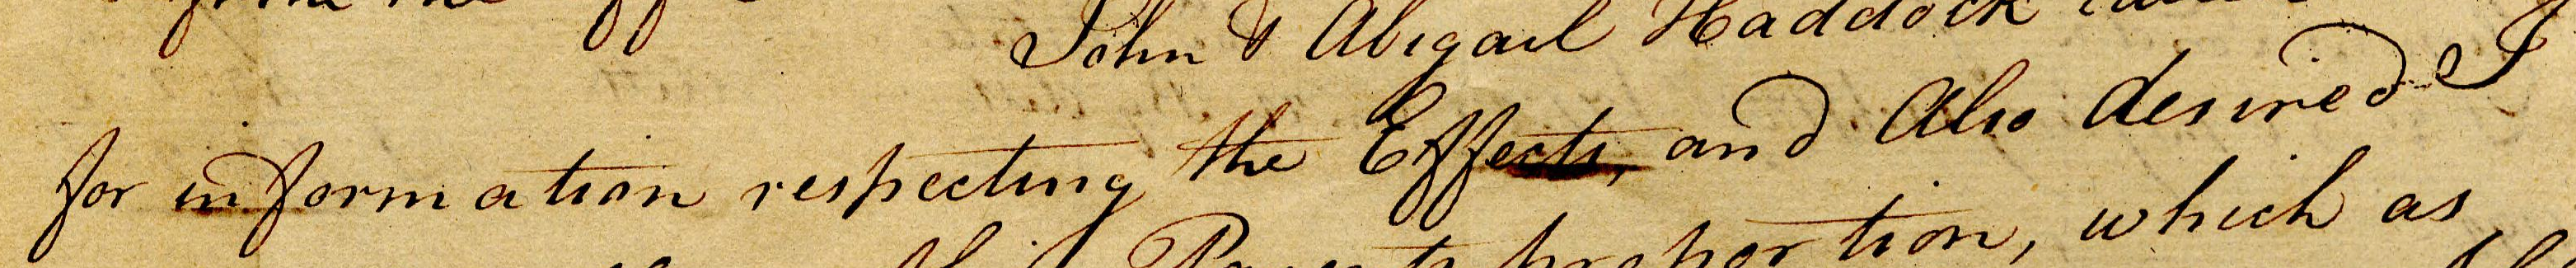for information respecting the Effects and Also desired I
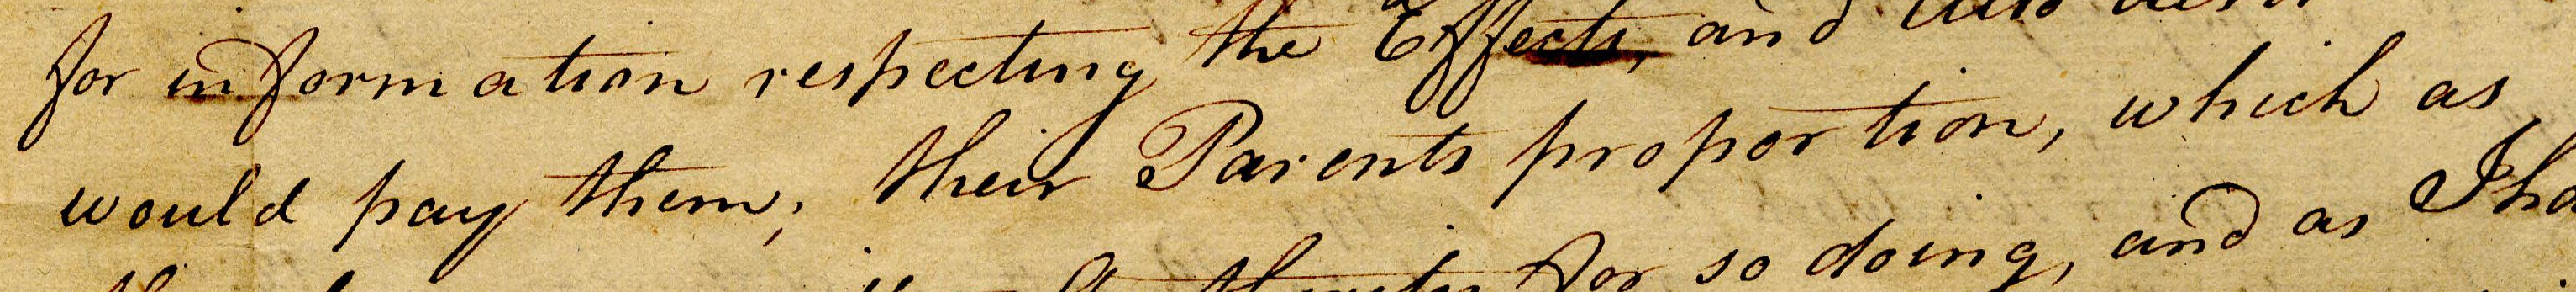would pay them; their Parents proportion, which as
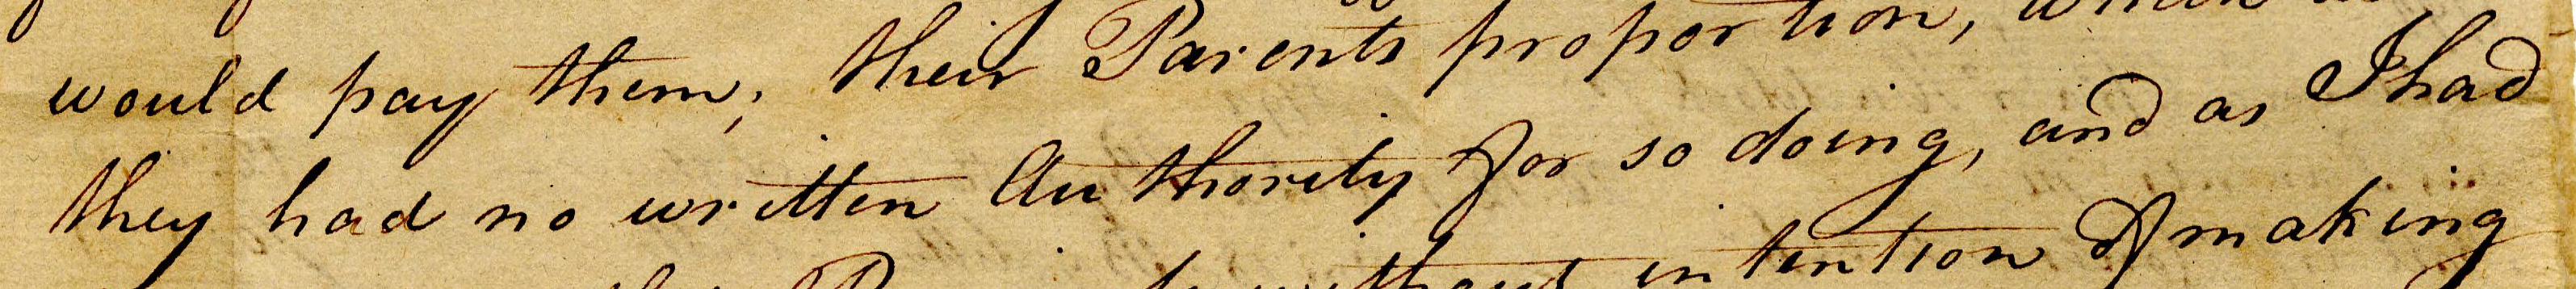they had no written Authority for so doing, and as I had
